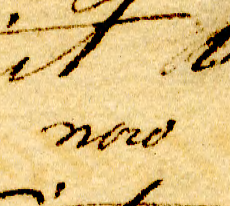now
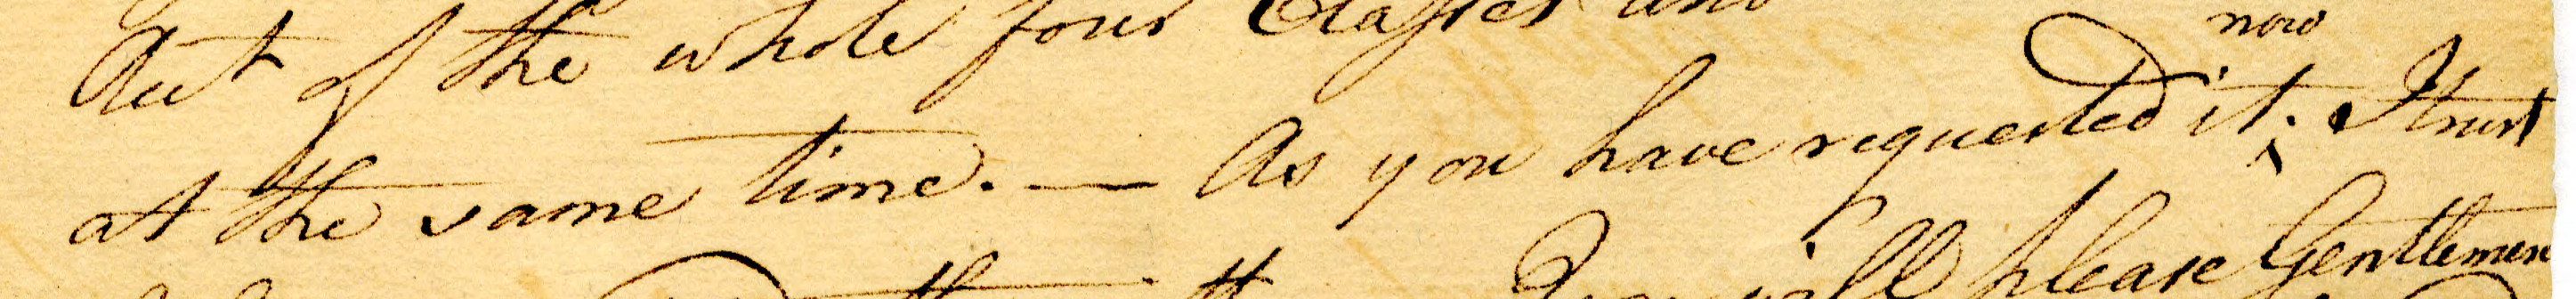at the same time.- As you have requested it ^ that
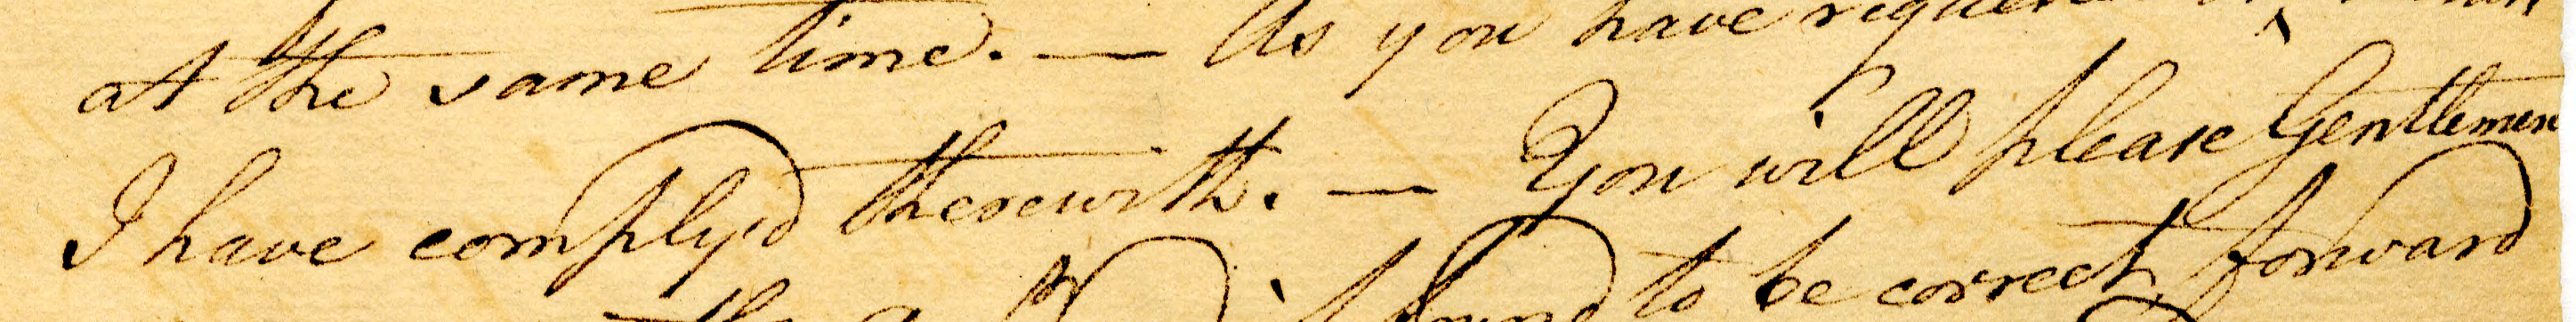I have comply'd therewith.- You will please Gentlemen
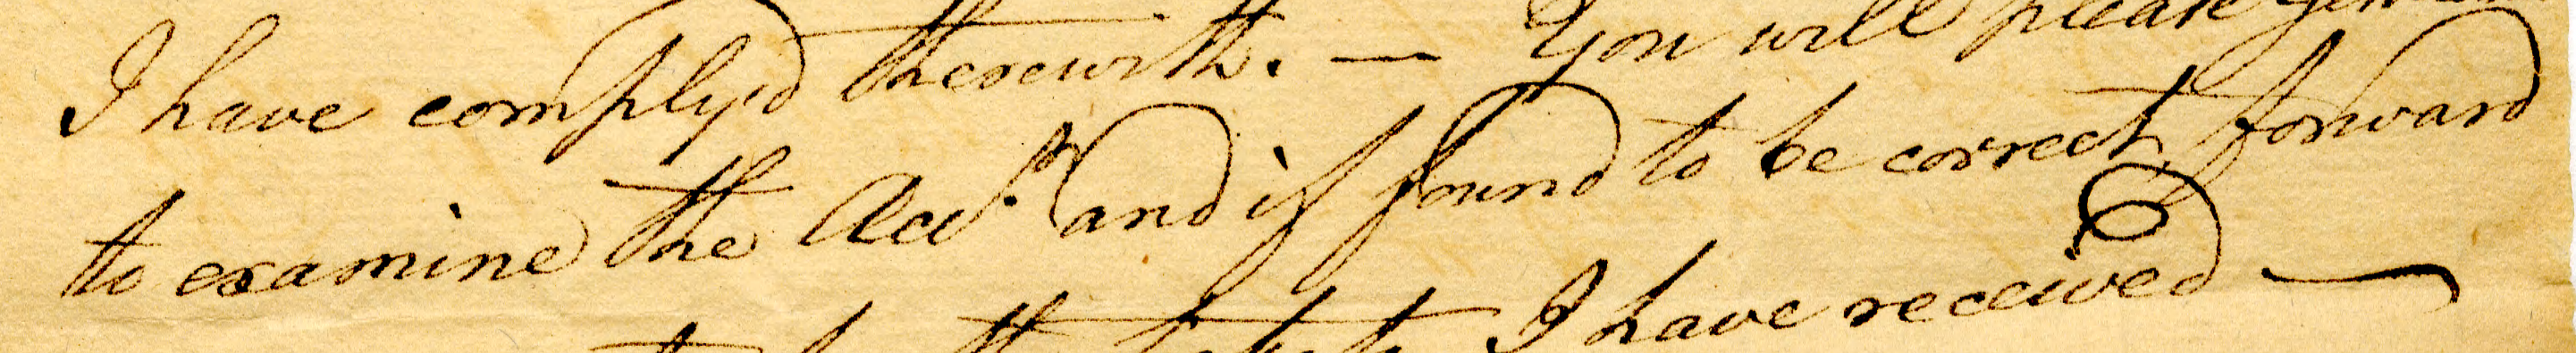to examine the Acc^t. and if found to be correct forward
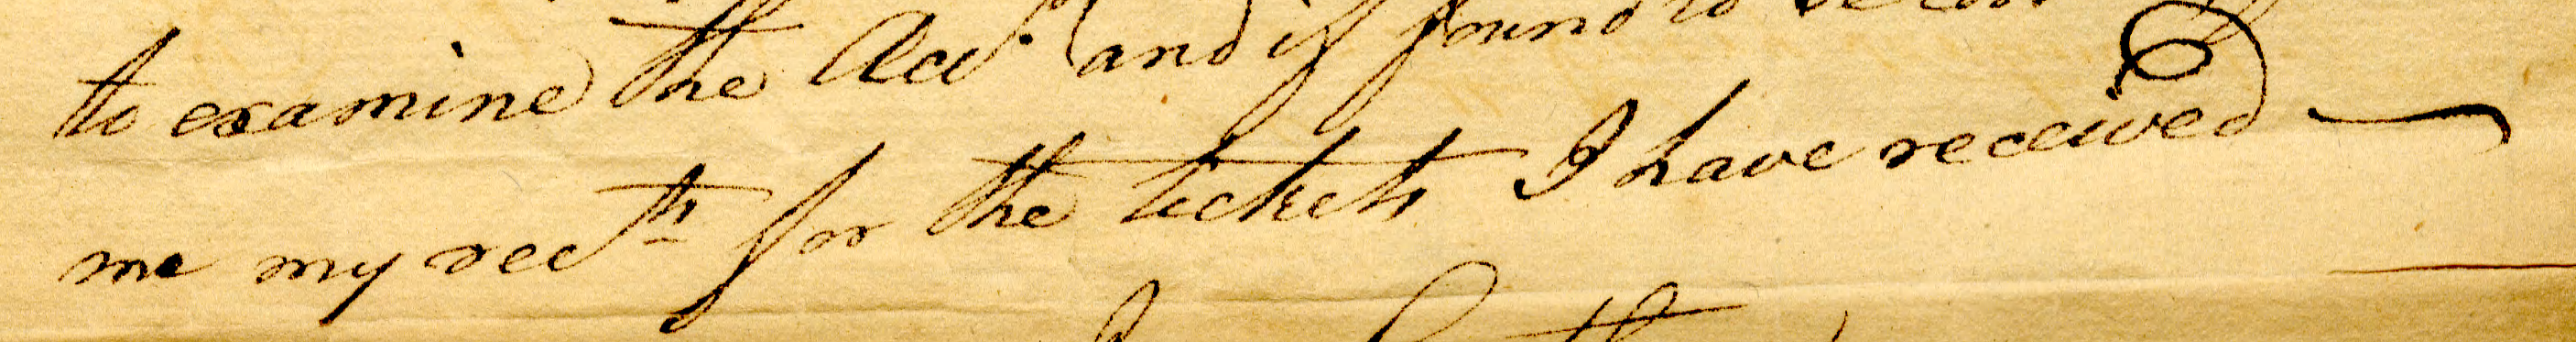me my rec^ts for the tickets I have received-
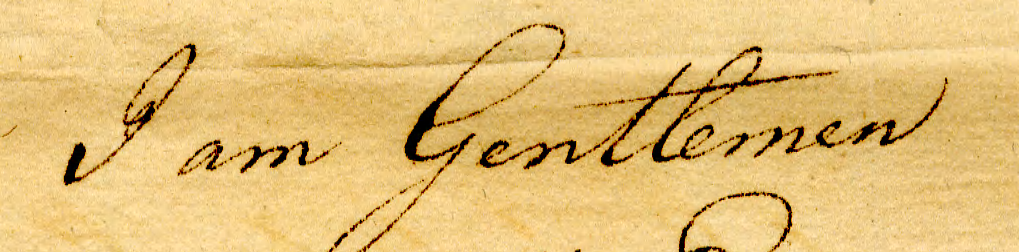I am Gentlemen
